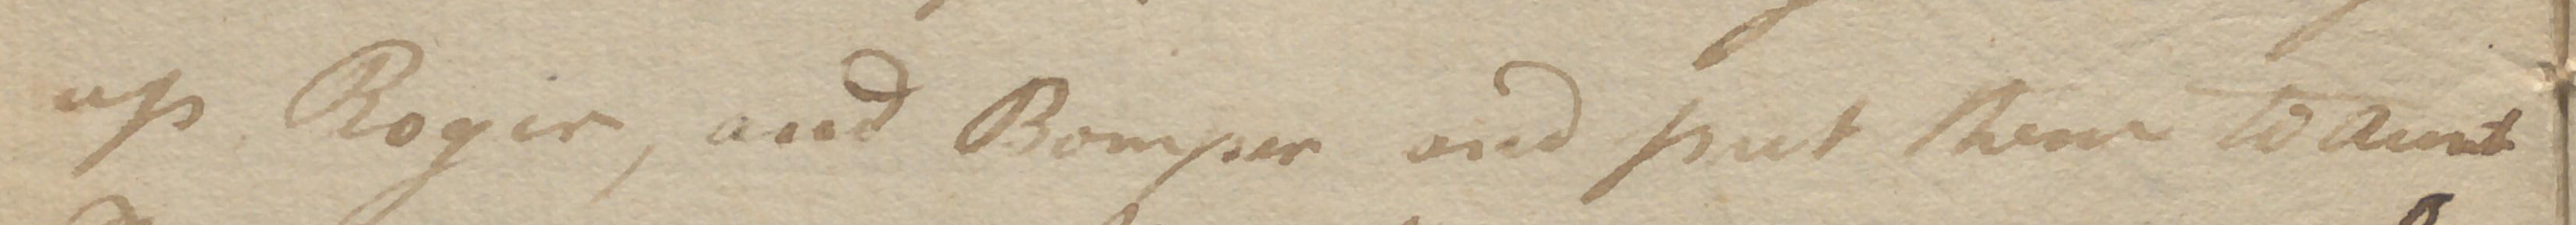up Roger, and Bomper and put them to aunt
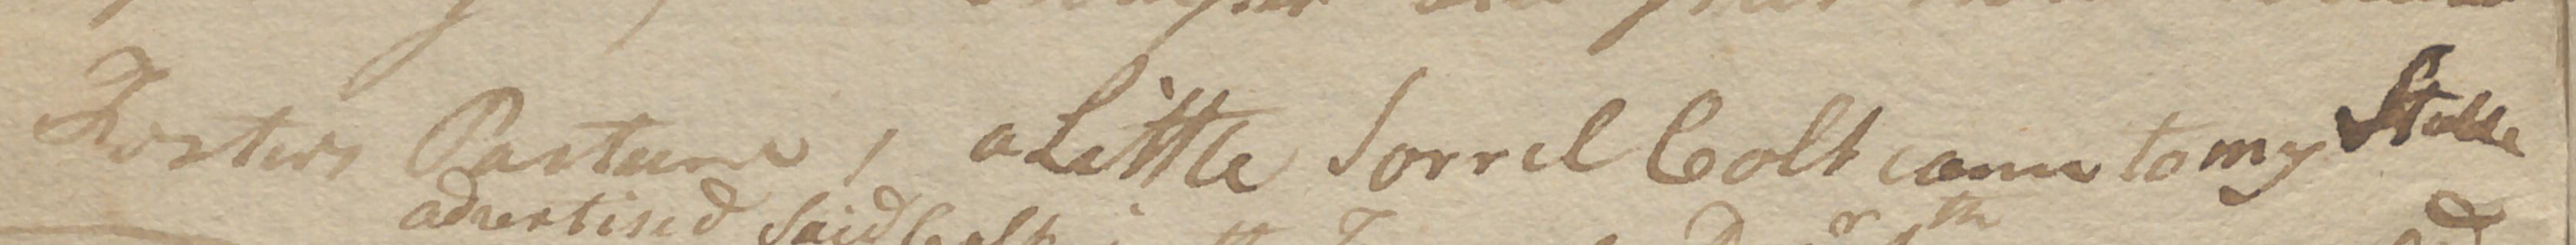Fosters Pasture, a Little Sorrel Colt cam to my Stable
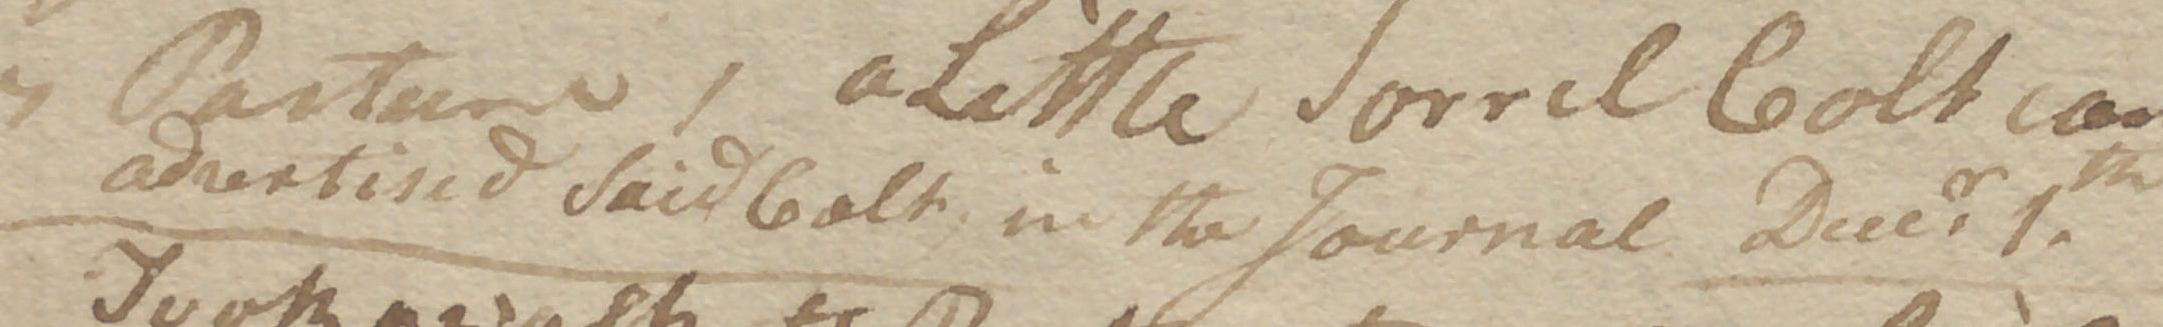advertised Said Colt in the Journal Dece^r. 1^th.
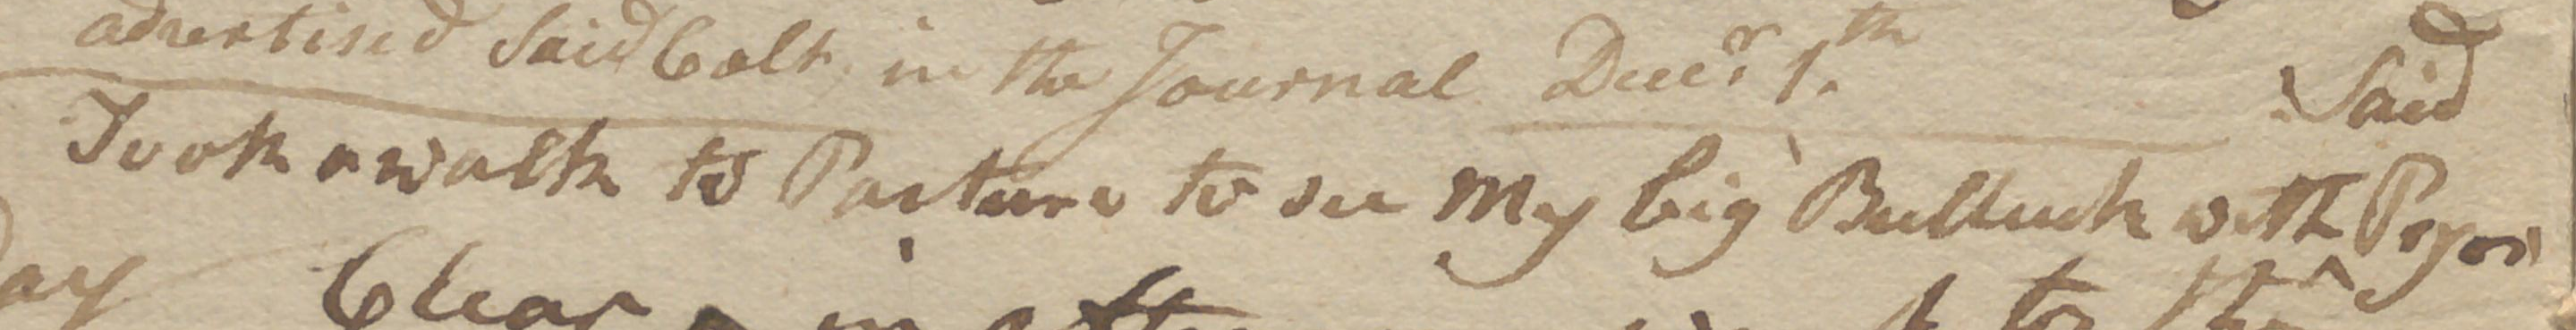Took a walk to Pasture to see My big Bulluck with ^ Pryor
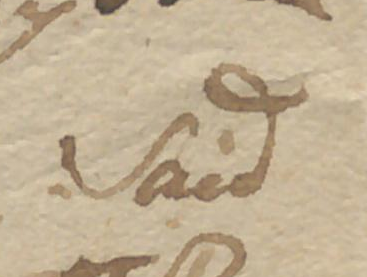Said
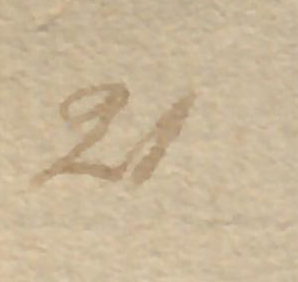21
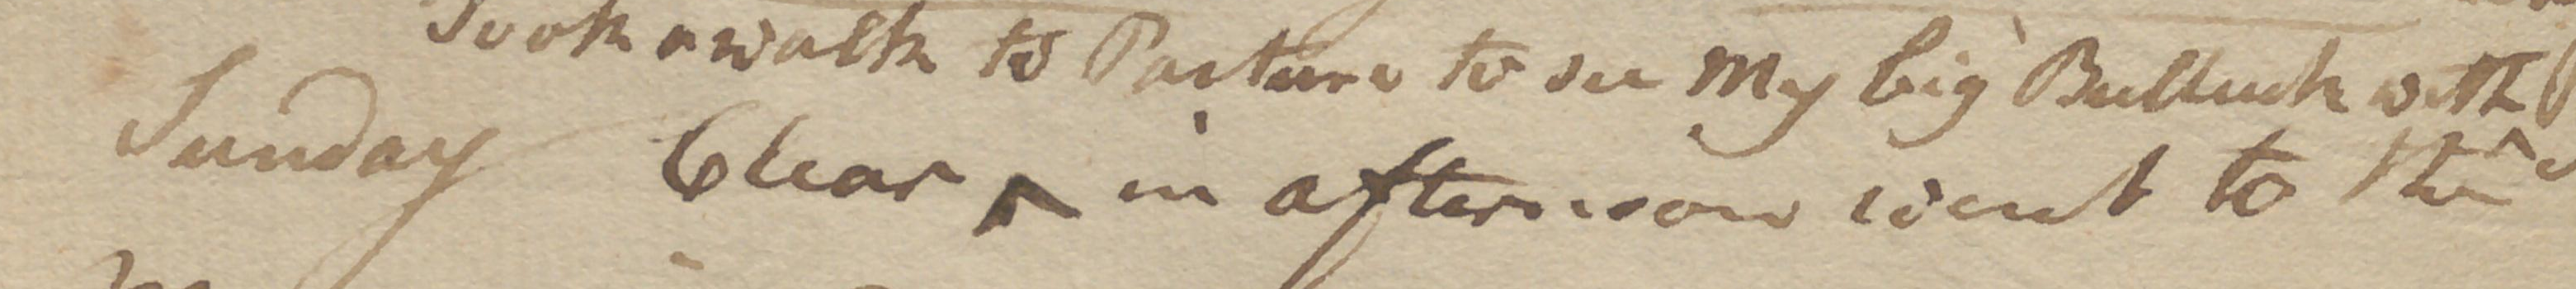Sunday Clear- in afternoon went to the
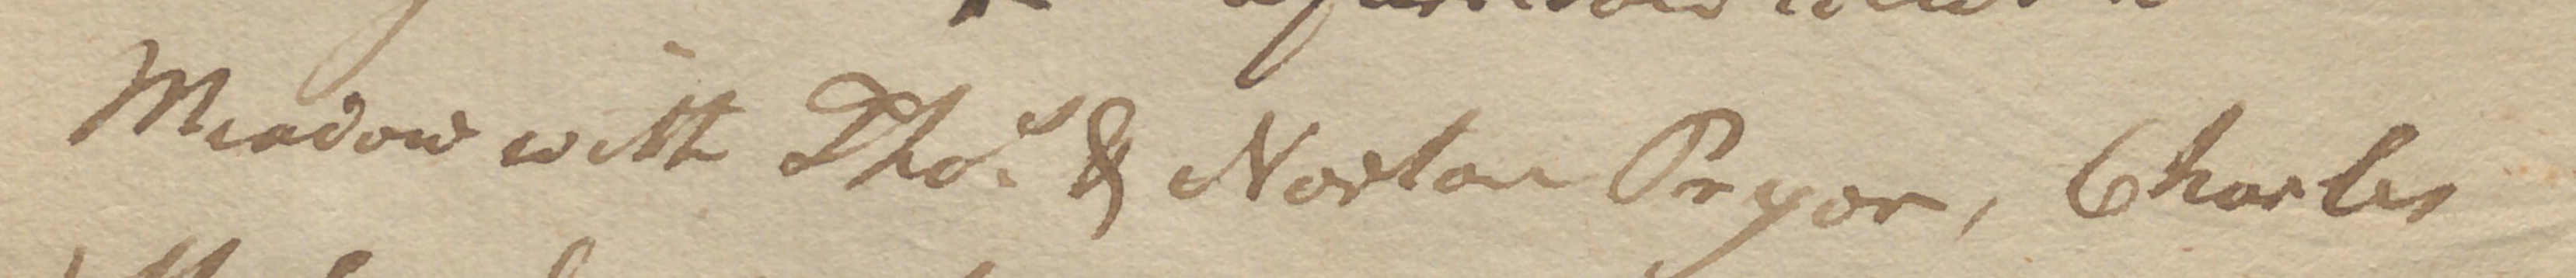Meadow with Tho^s. & Norton Pryor, Charles
